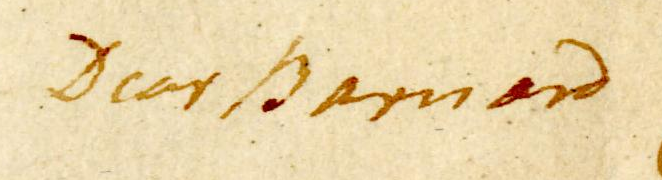Dear Barnard
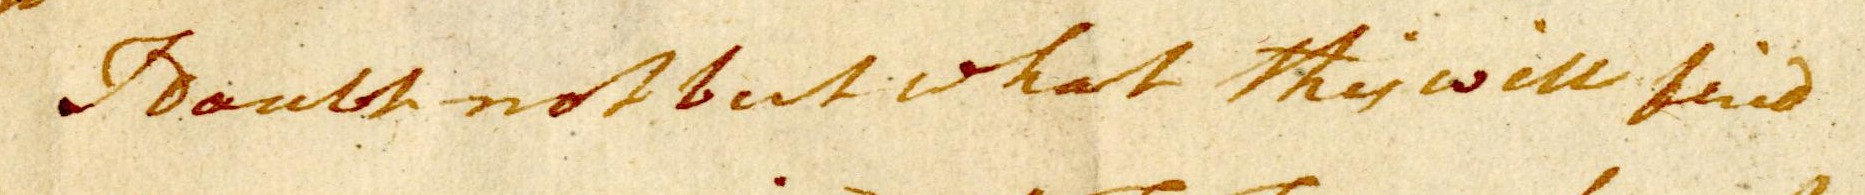I doubt not but what this will find
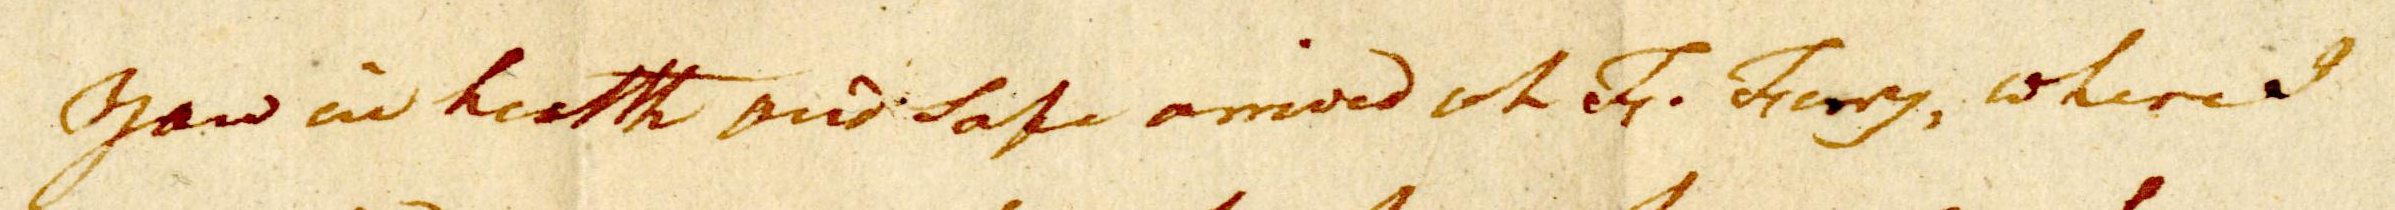You in health and safe arrived at F. Ferry, where I
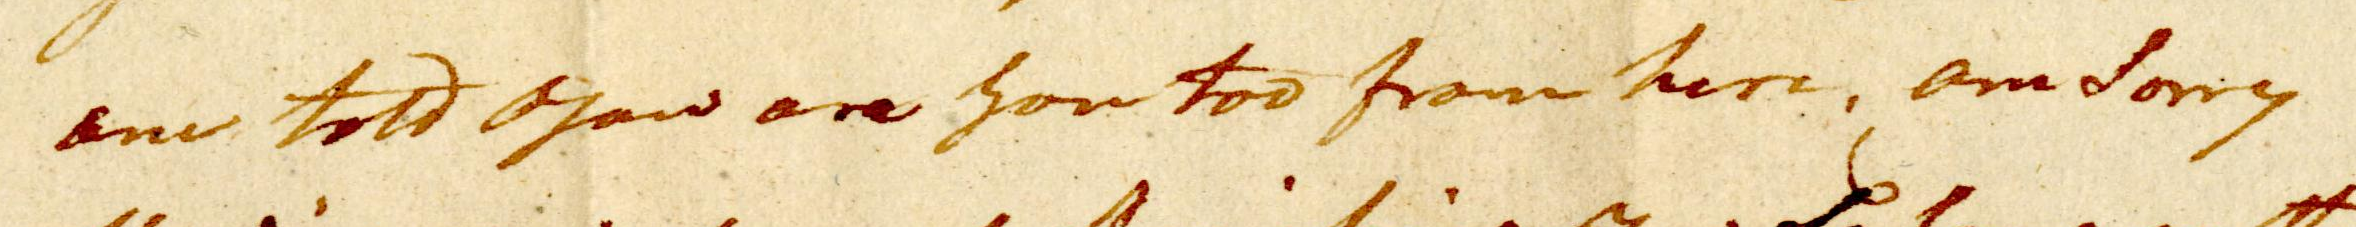am told you are gone too from here, am Sorry
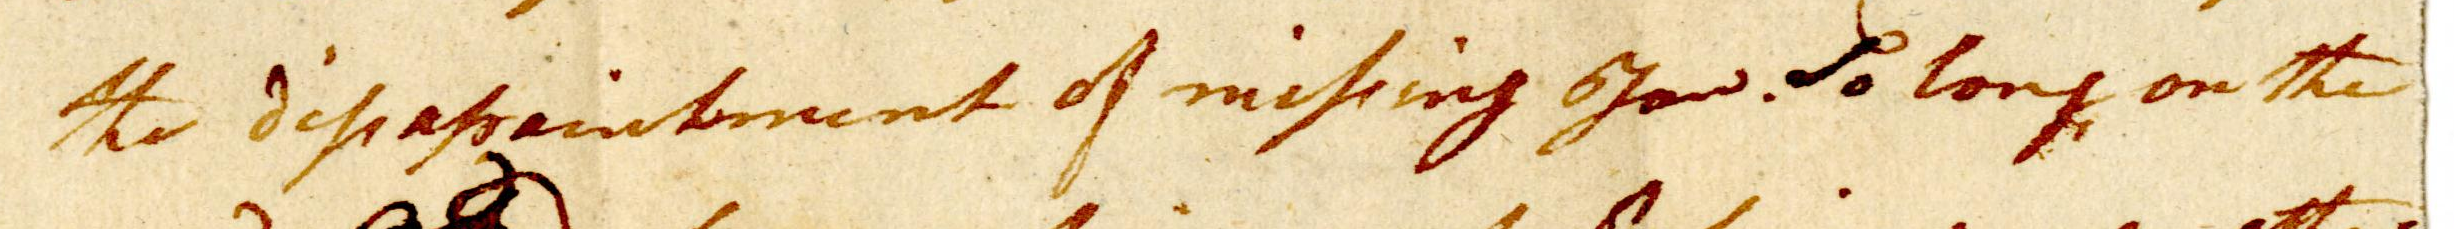the dissapointment of missing you. To long on the
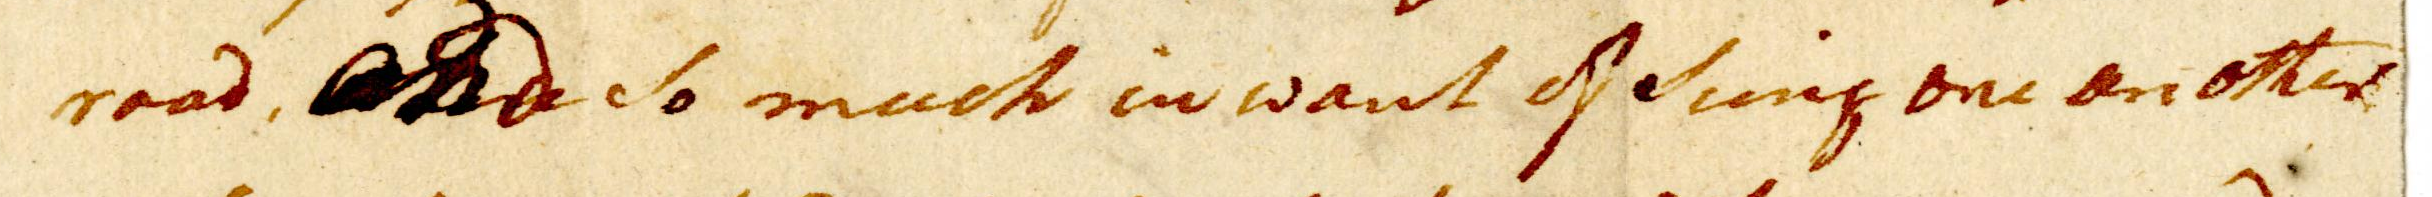road and So much in want of seing one another
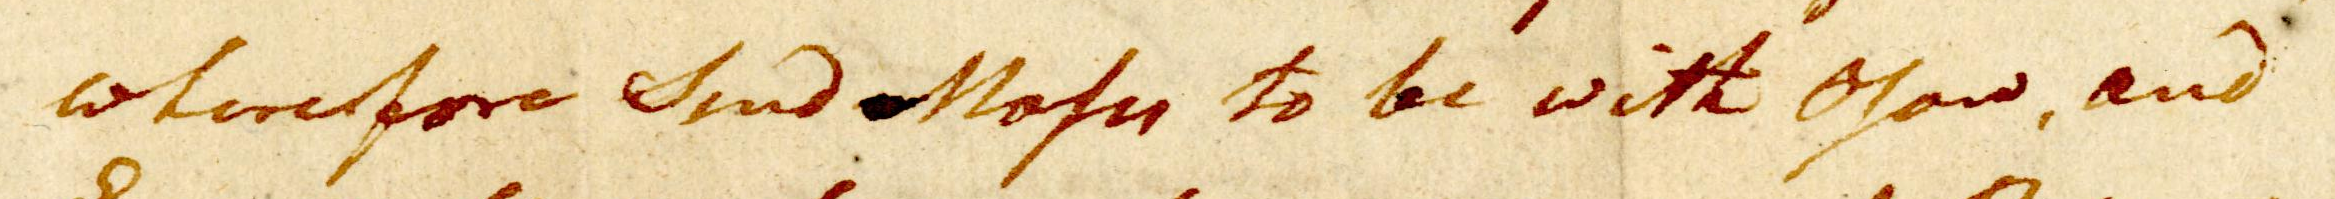wherefore Send Moses to be with you, and
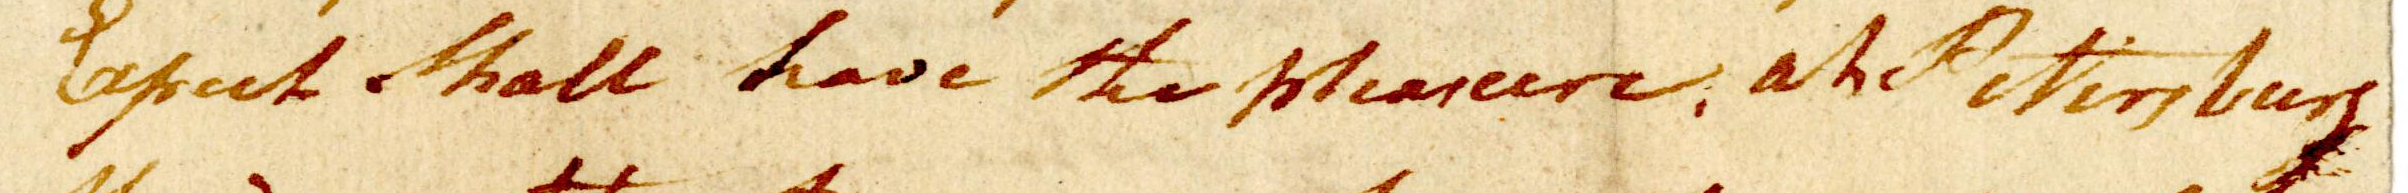Expect shall have the pleasure, at Petersburg
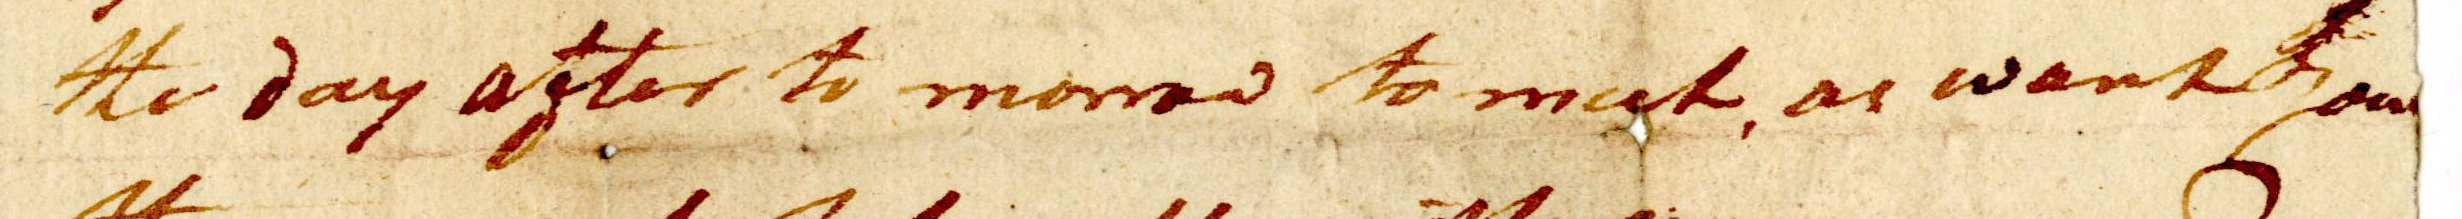the day after to morrow to meet, as want You
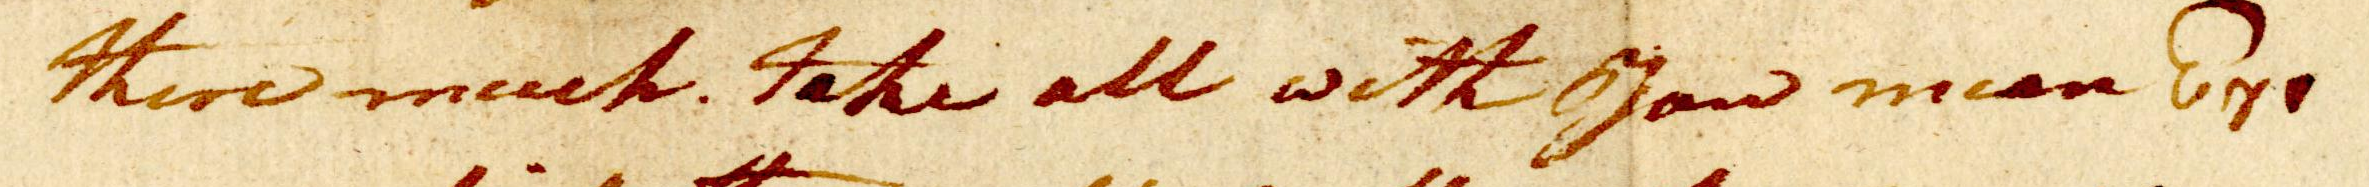there much. Take all with you mean Ere
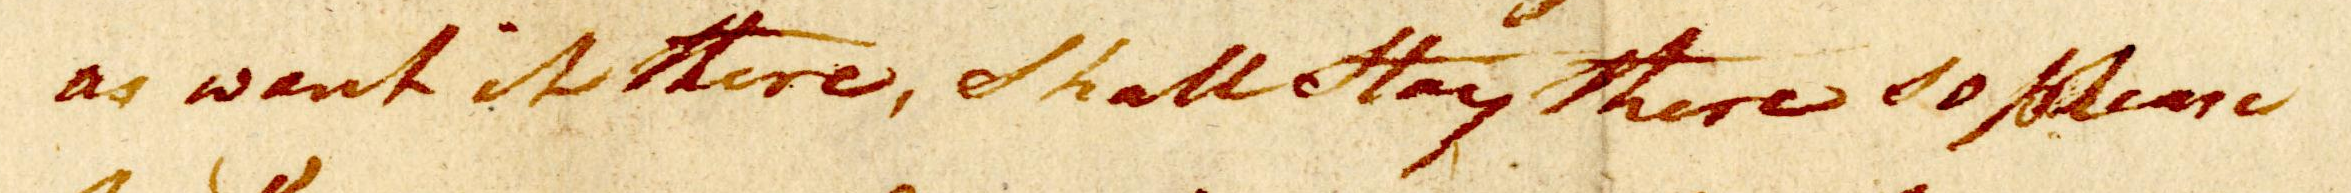as want it there, shall Stay there so please
